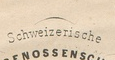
Schweizerische
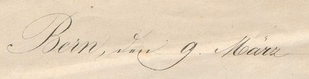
Bern, den 9. März
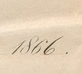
1866.
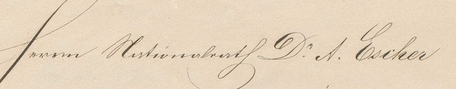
Herrn Nationalrath Dr A. Escher
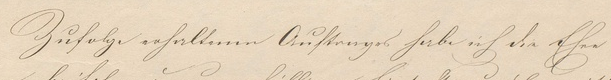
Zufolge erhaltenen Auftrages habe ich die Ehre
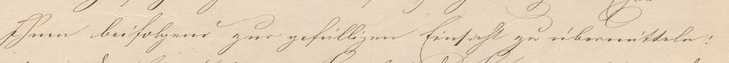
Ihnen beigolgend zur gefälligen Einsicht zu übermitteln:
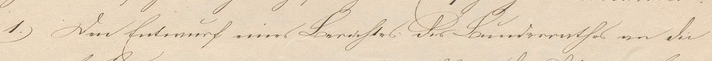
1.) Den Entwurt eines Berichtes des Bundesrathes an die
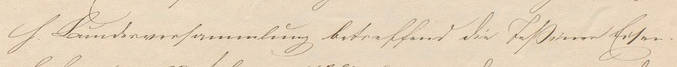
h. Bundesversammlung betreffend die Teßiner Eisen-
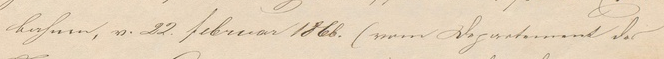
bahnen, v. 22. Februar 1866. (vom Departement des
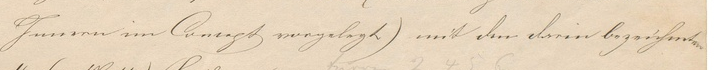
Innern im Concept vorgelegt) mit den darin bezeichneten
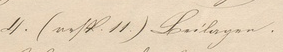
4. (resp. 11.) Beilagen.
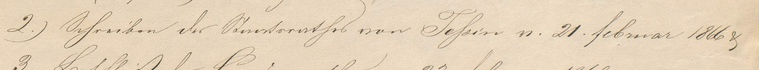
2.) Schreiben des Staatsrathes von Tessin v. 21. Februar 1866 &
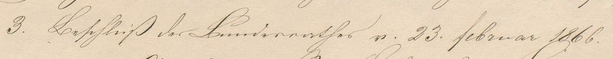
3. Beschluß des Bundesrathes v. 23. Februar 1866.
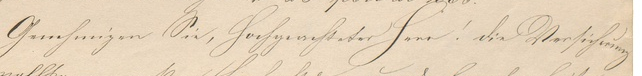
Genehmigen Sie, Hochgeachteter Herr! die Versicherung
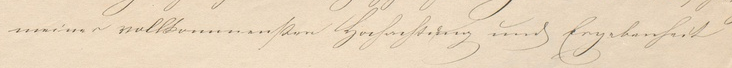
meiner vollkommensten Hochachtung und Ergebenheit
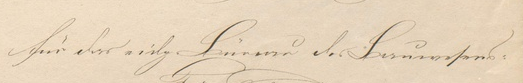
Für das eidg. Büreau des Bauwesens:
